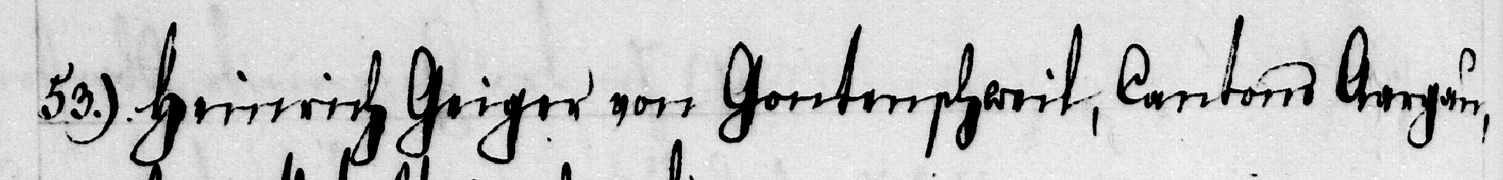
53.) Heinrich Geiger von Gontenschweil, Cantons Aargau,
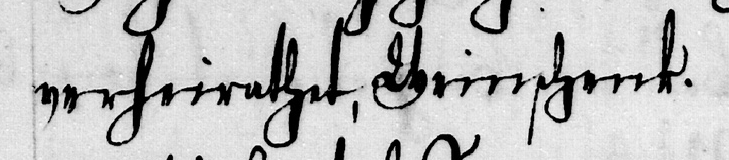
verheirathet, Weinschenk.
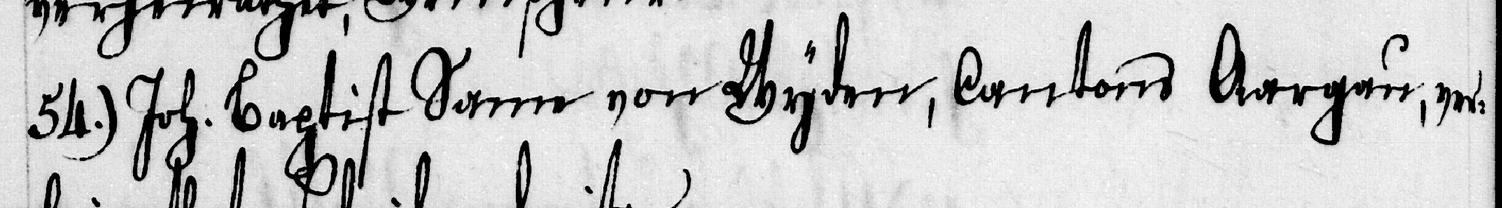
54.) Joh. Baptist Same von Wyden, Cantons Aargau, ver¬
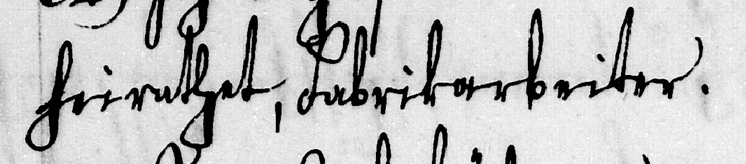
heirathet, Fabrikarbeiter.
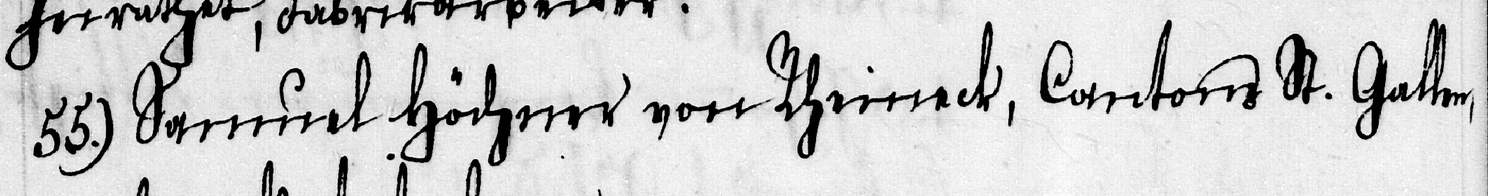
55.) Samuel Höchner von Rheineck, Cantons St. Galle¬
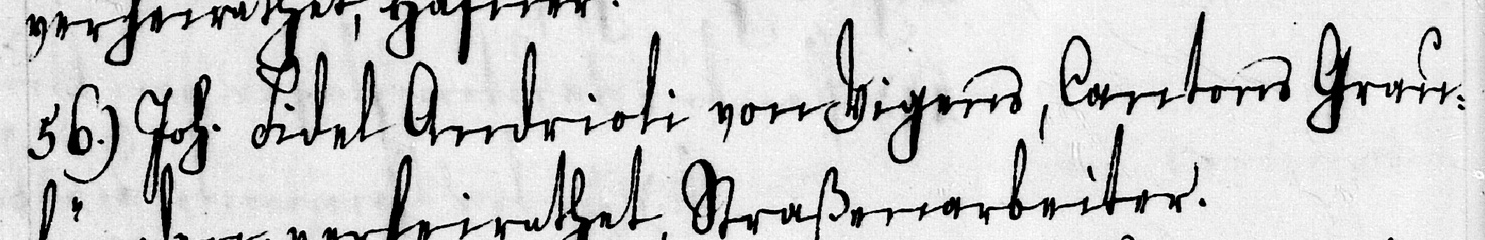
56.) Joh. Fidel Andrioli von Vigens, Cantons Grau¬
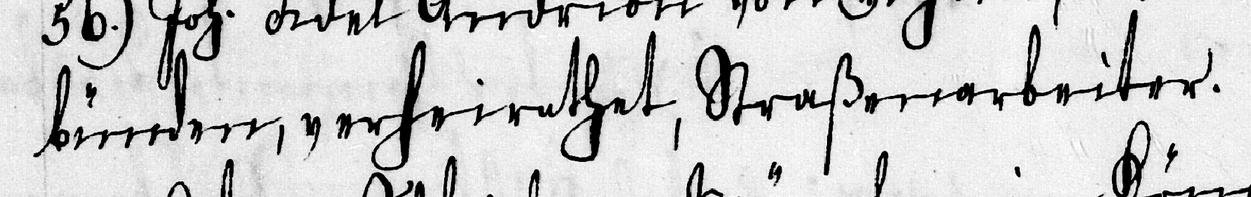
bünden, verheirathet, Straßenarbeiter.
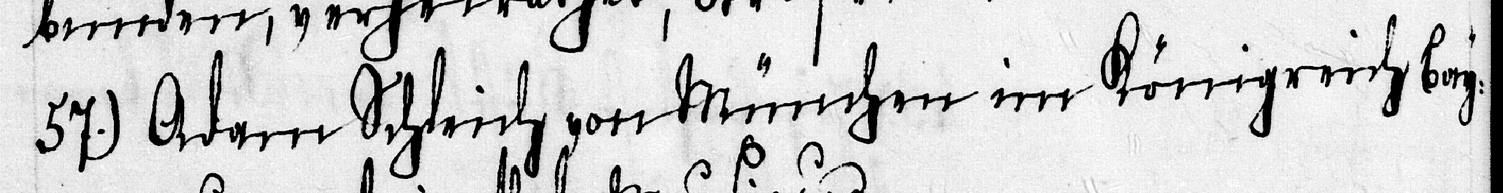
57.) Adam Schleich von München im Königreich Bay¬
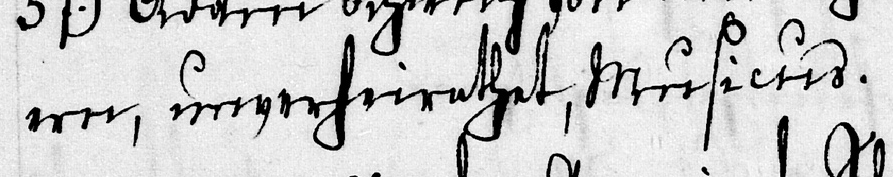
ern, unverheirathet, Musicus.
